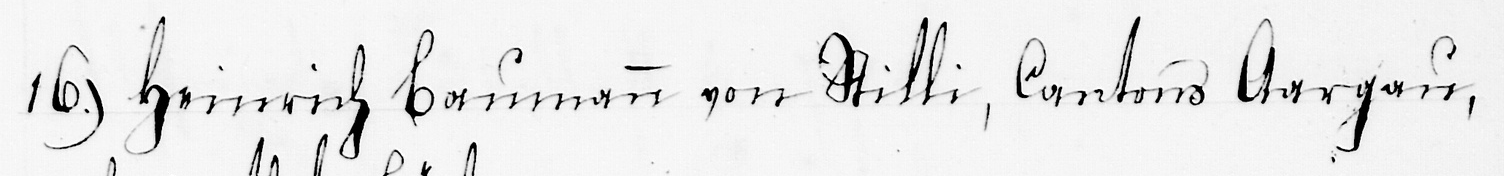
16. Heinrich Baumann von Stilli, Cantons Aargau,
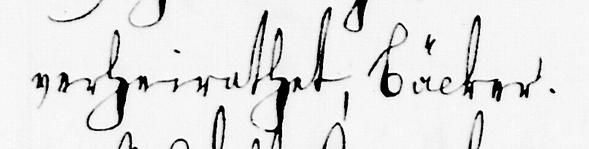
verheirathet, Bäcker.
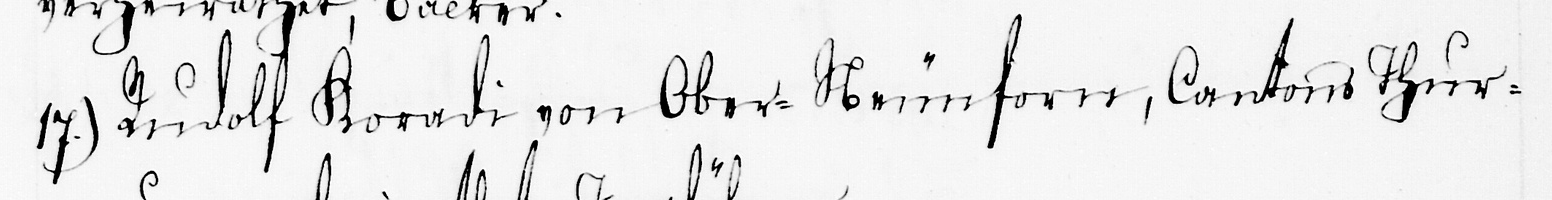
17.) Rudolf Koradi von Ober-Neunforn, Cantons Thur¬
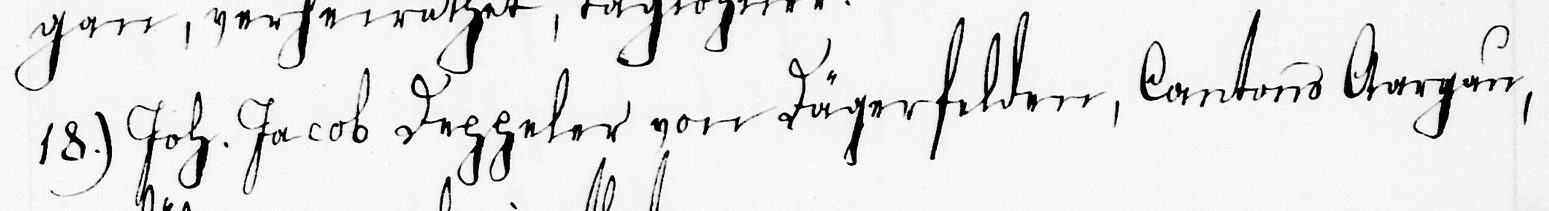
18.) Joh. Jacob Deppeler von Dägerfelden, Cantons Aargau,
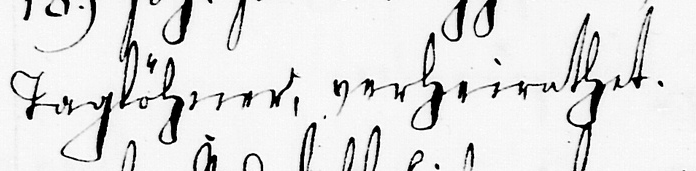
Taglöhner, verheirathet.
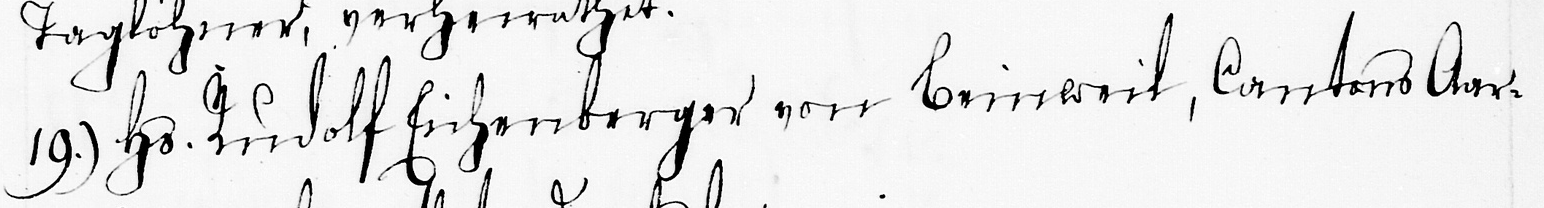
19.) Hs. Rudolf Eichenberger von Beinweil, Cantons Aar¬
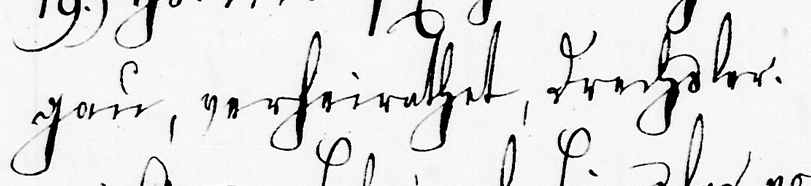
gau, verheirathet, Drechsler.
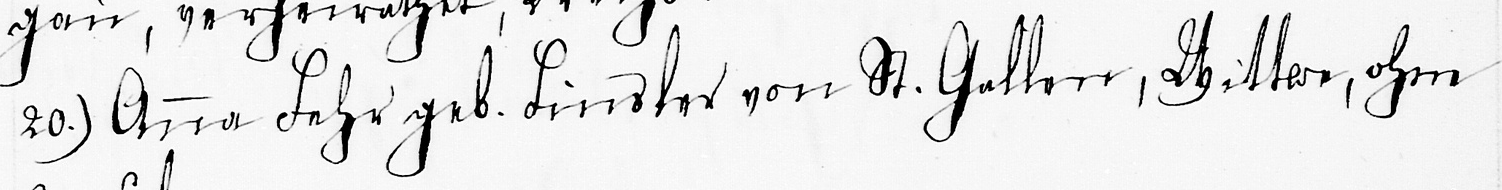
20.) Anna Fehr geb. Finsler von St. Gallen, Wittwe, ohne
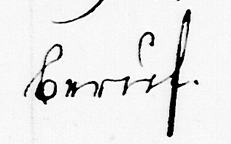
Beruf.
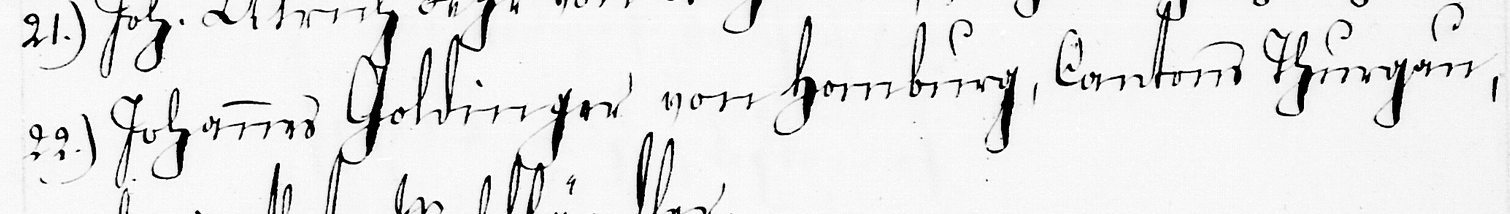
22.) Johannes Goldinger von Homburg, Cantons Thurgau,
